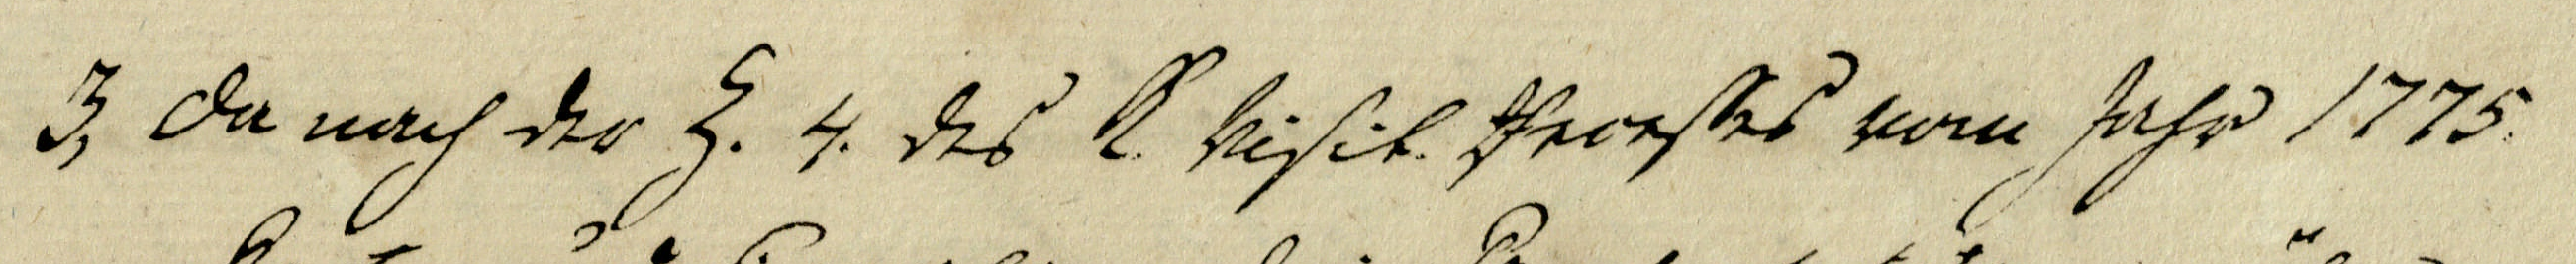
3. Da nach der Z. 4. des K. Visit Recesses vom Jahr 1775.
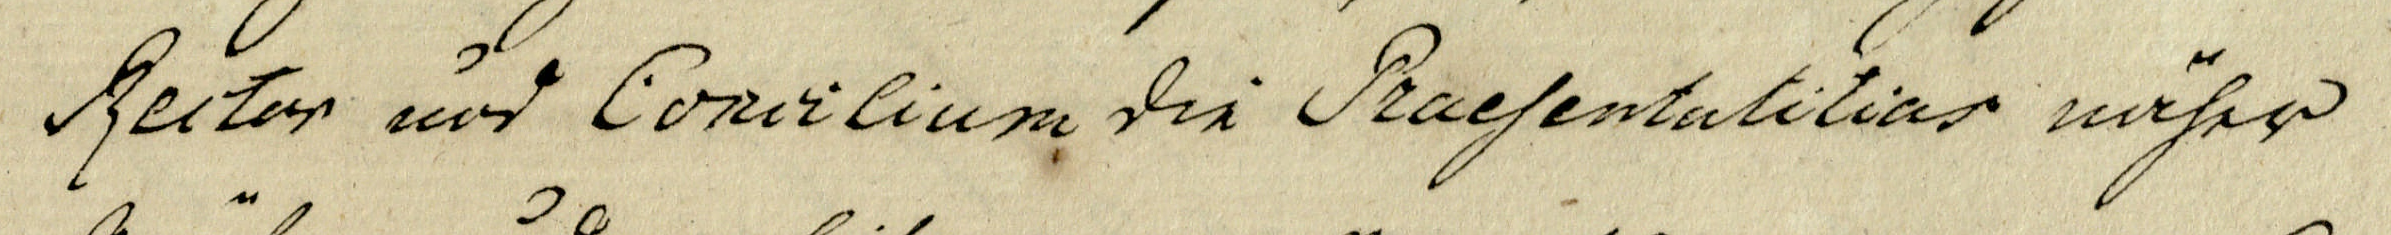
Rector und Concilium die Praesentatitias näher
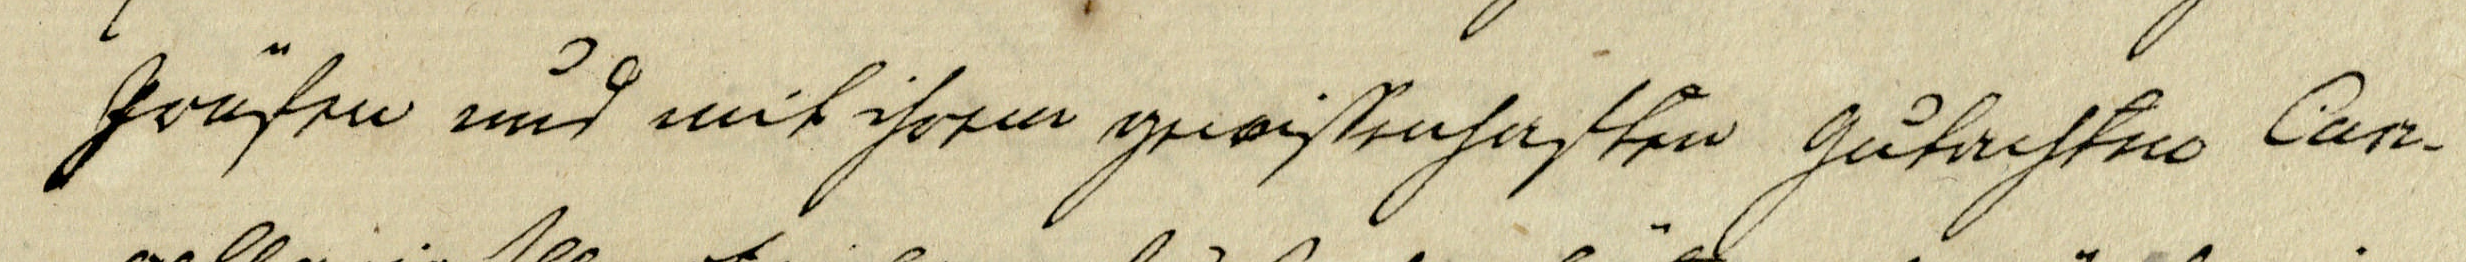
prüfen und mit ihrem gewissenhaften Gutachten Can¬
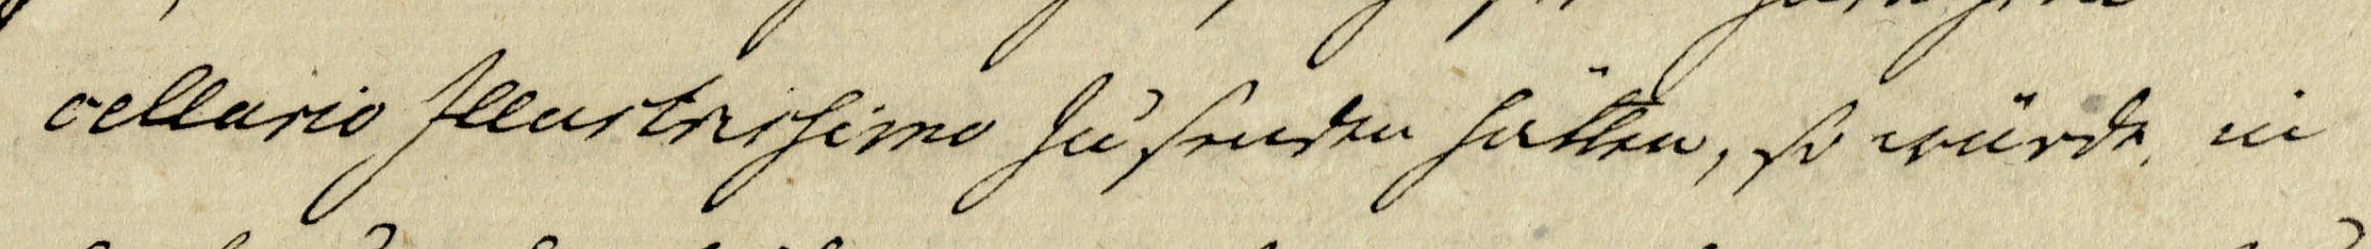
cellario Illustrissimo zu senden hätten, so würde, in
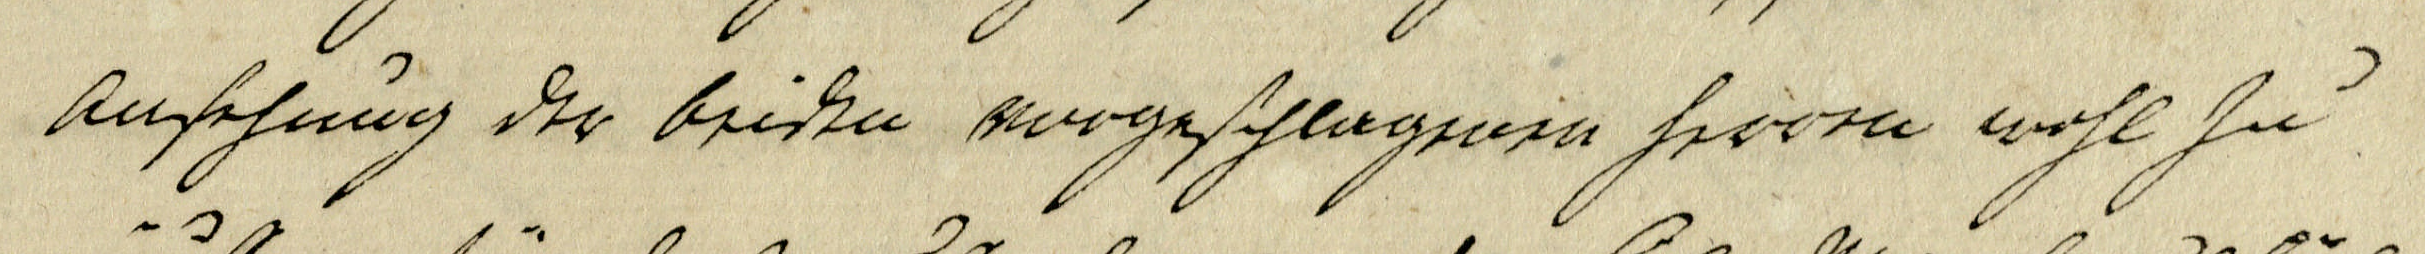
Ansehung der beiden vorgeschlagenen Herren wohl zu
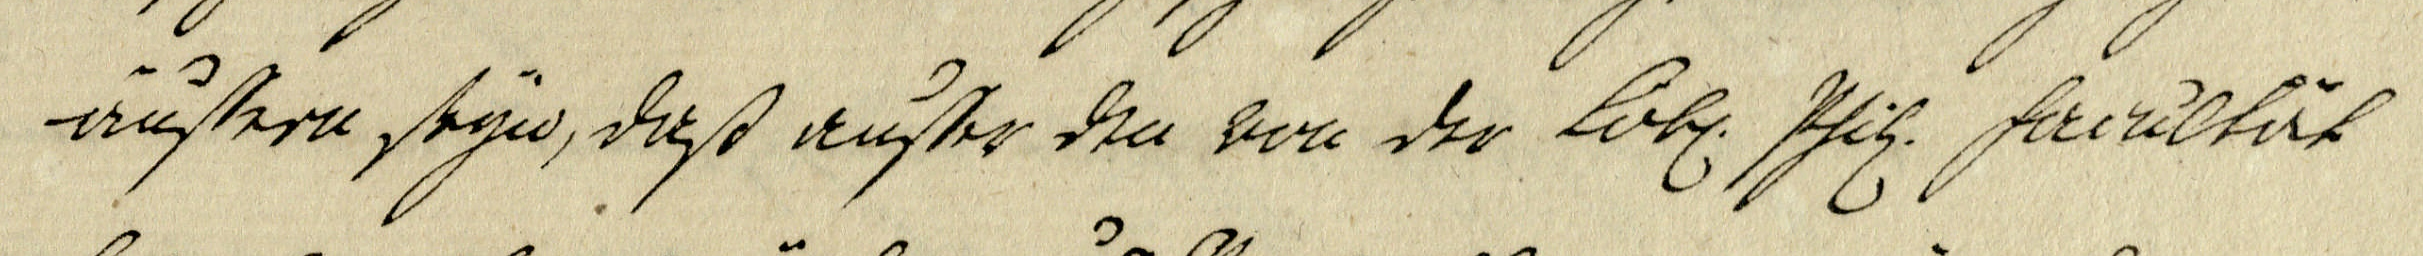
äussern seÿn, daß ausser den von der Löbl. Phil. Facultät
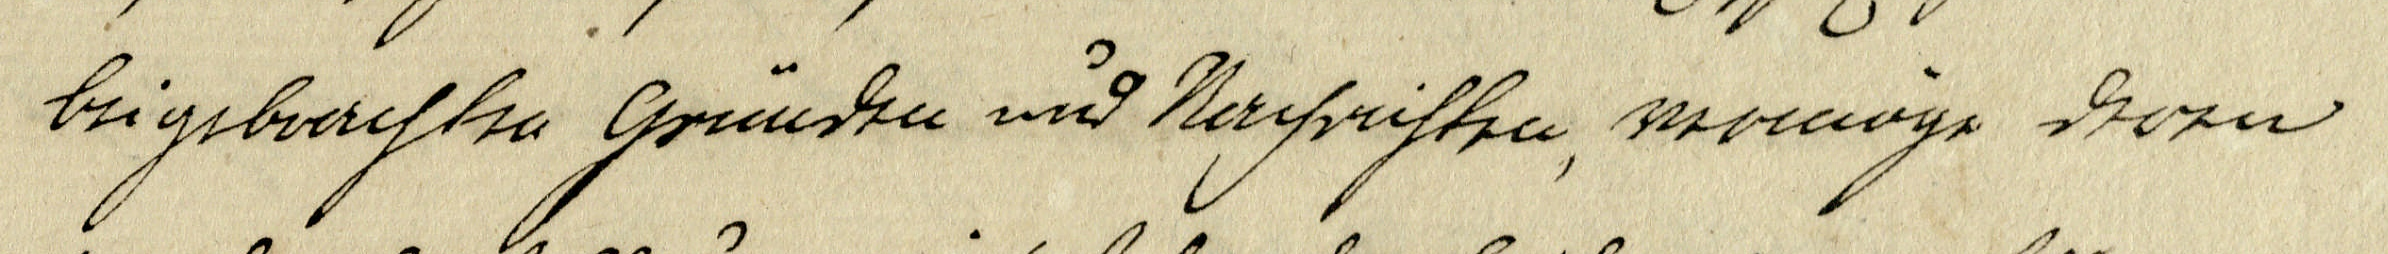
beigebrachten Gründen und Nachrichten vermöge deren
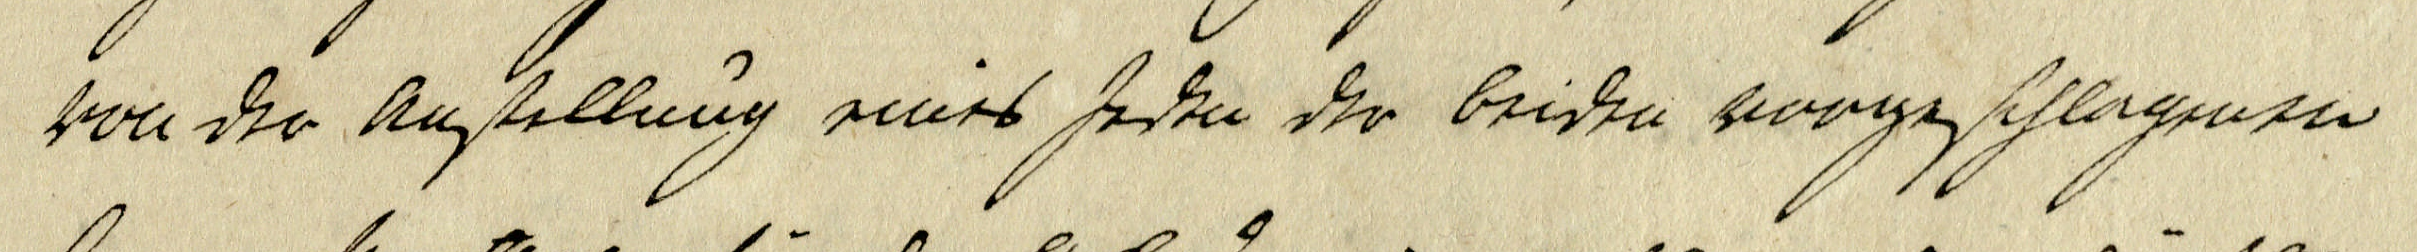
von der Anstellung eines Jeden der beiden vorgeschlagenen
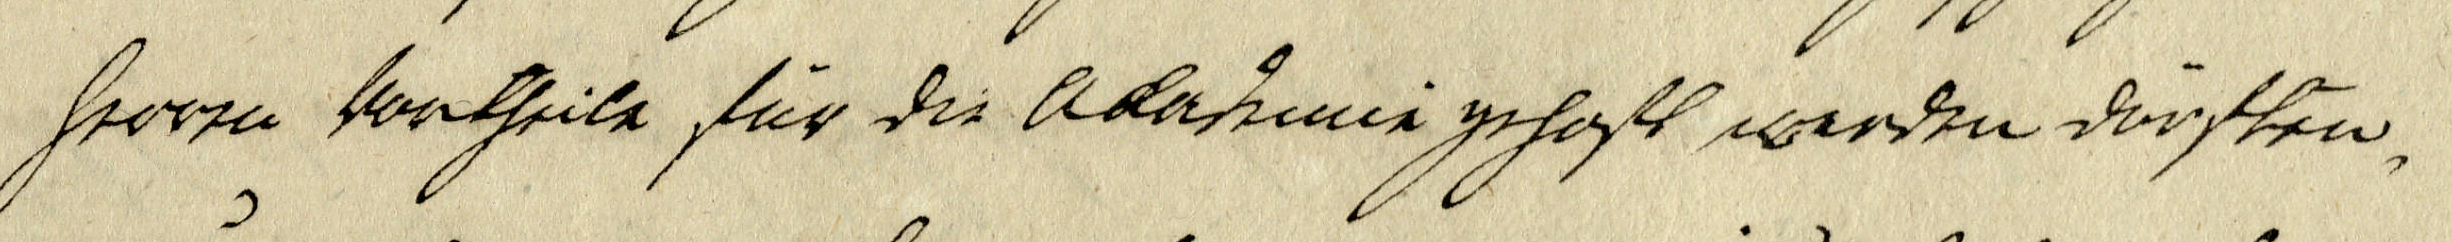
Herren Vortheile für die Akademie gehoft werden dürften,
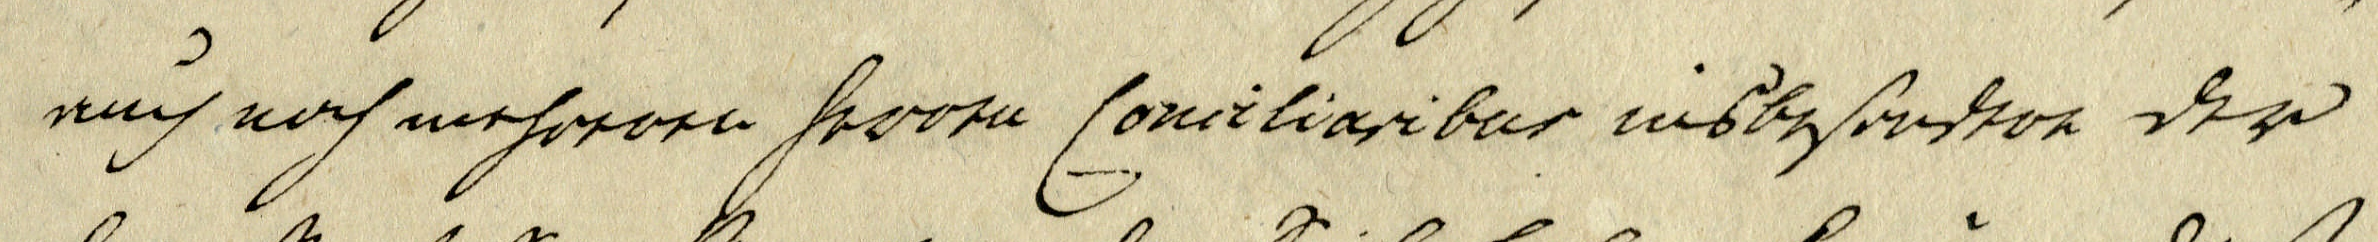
auch noch mehreren Herren Conciliaribus insbesondere der
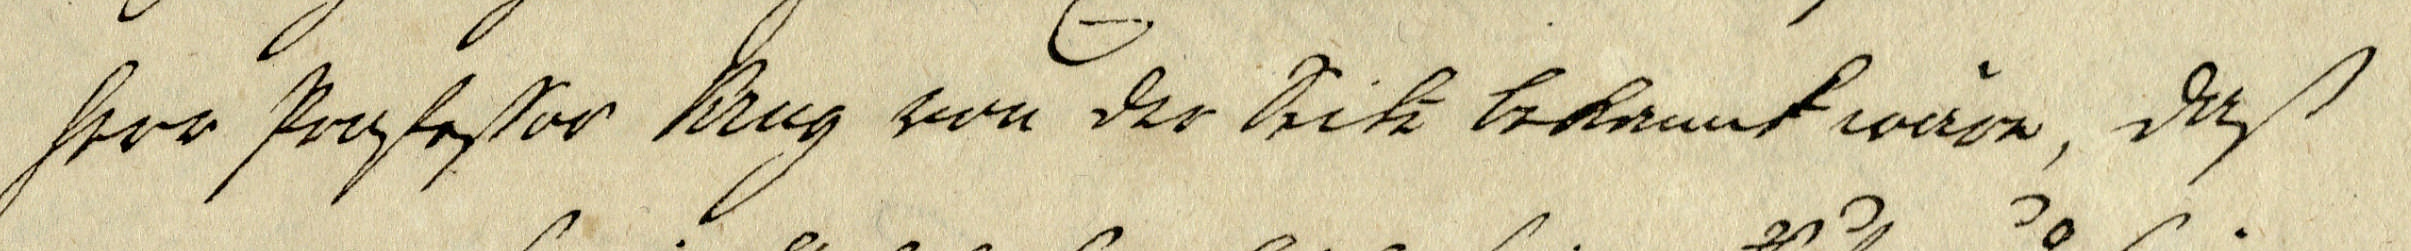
Herr Professor Krug von der Seite bekannt wäre, daß
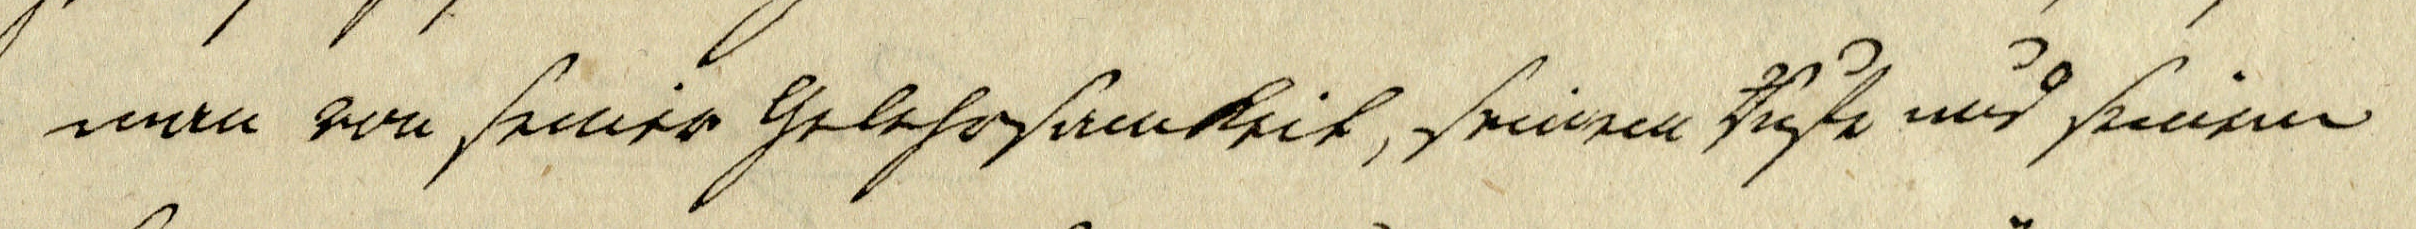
man von seiner Gelehrsamkeit, seinem Rufe und seinem
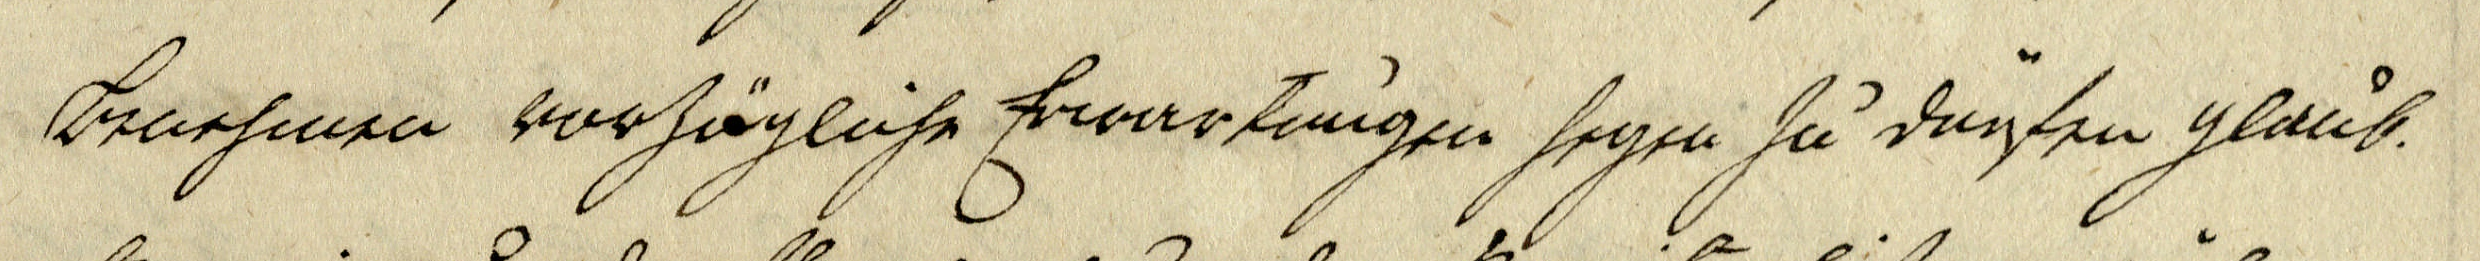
Benehmen vorzügliche Erwartungen hegen zu dürfen glaub¬
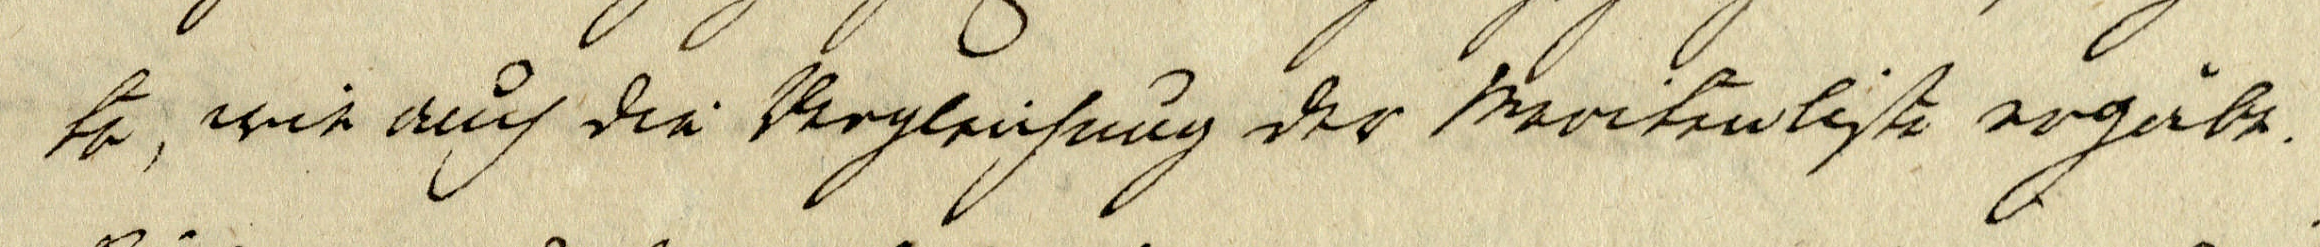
te, wie auch die Vergleichung der Meritenliste ergäbe.
